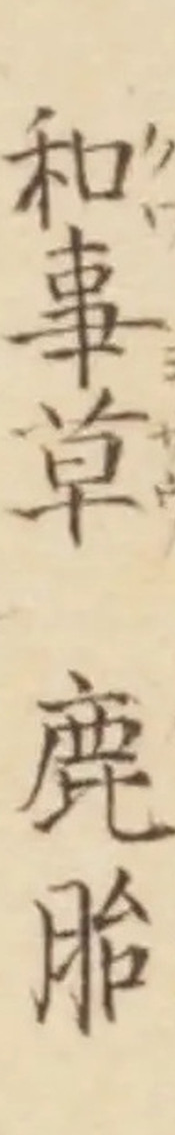和事草鹿胎
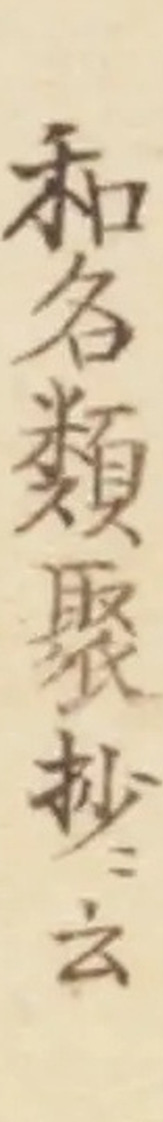和名類聚抄云

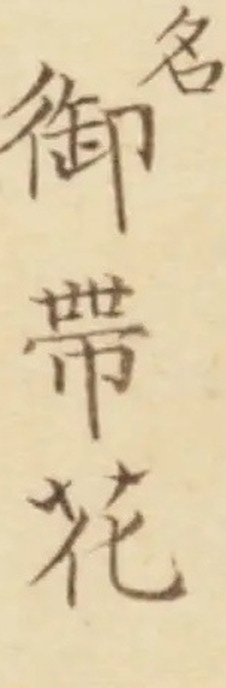御帯花
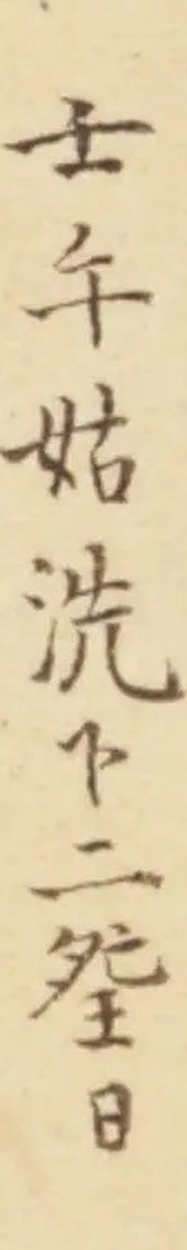壬午姑洗下二望日
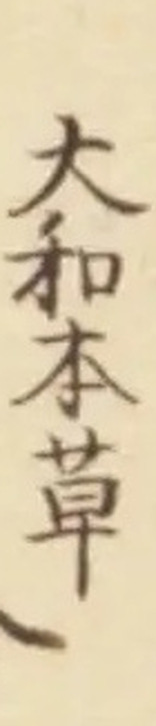大和本草
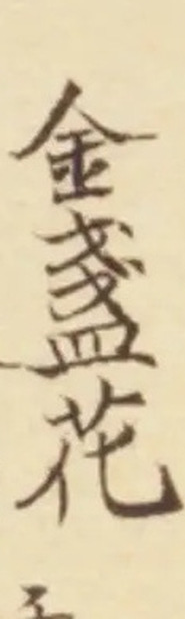金銭花
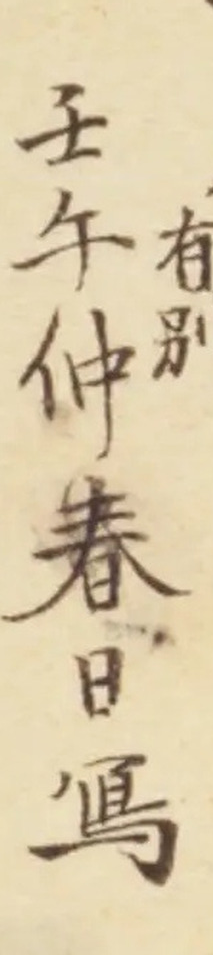壬午仲春日写
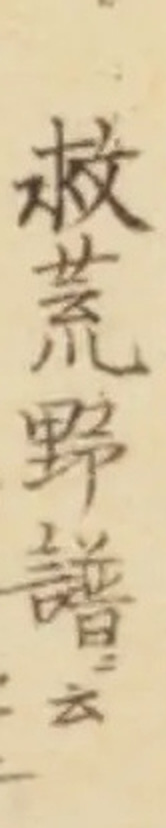救荒野譜云
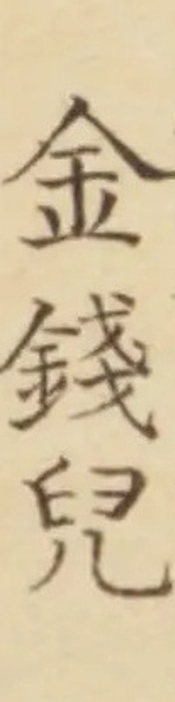金銭児
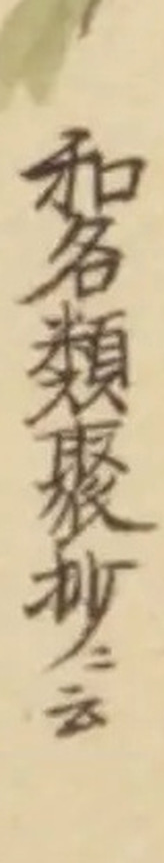和名類聚抄曰
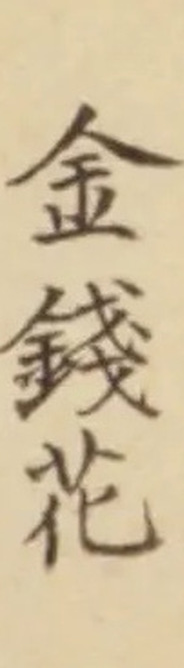金銭花
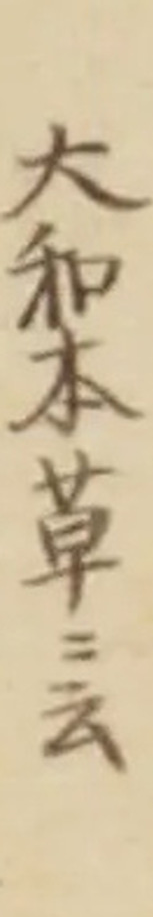大和本草云
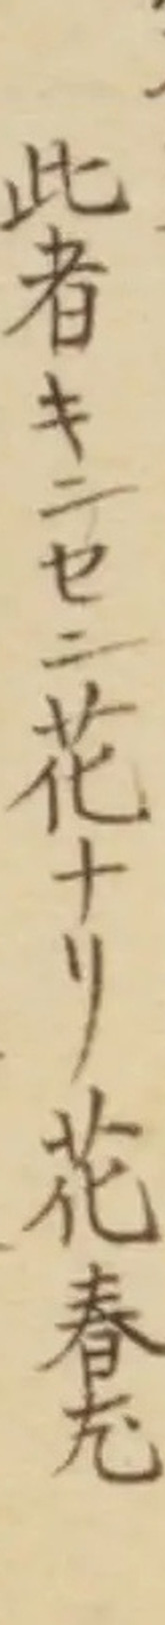此者キンセン花ナリ花春尤
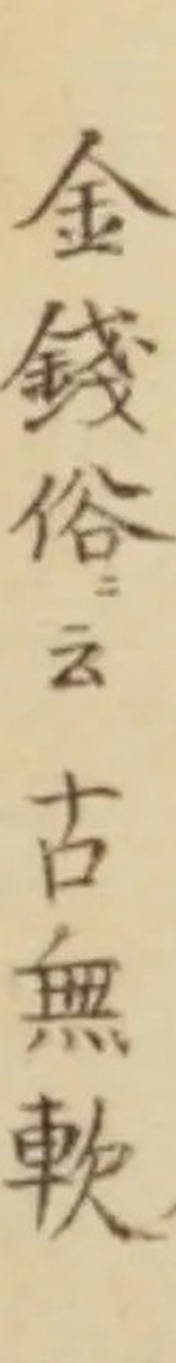金銭俗云古無軟
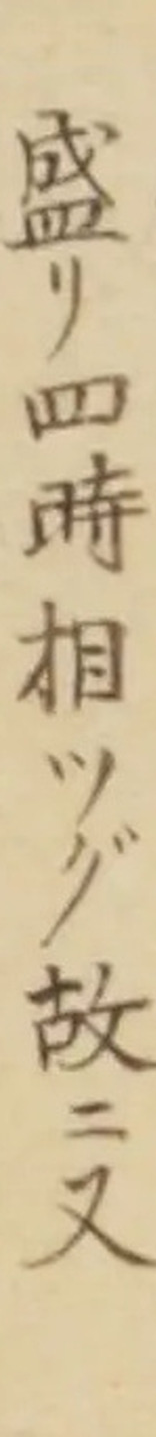盛リ四時相ツグ故ニ又

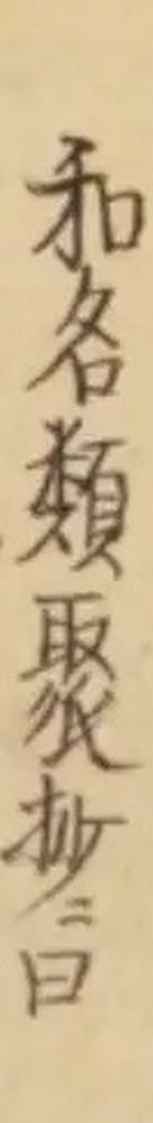和名類聚抄ニ曰
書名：梅園草木花譜春之部. 1
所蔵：国立国会図書館 National Diet Library, JAPAN
